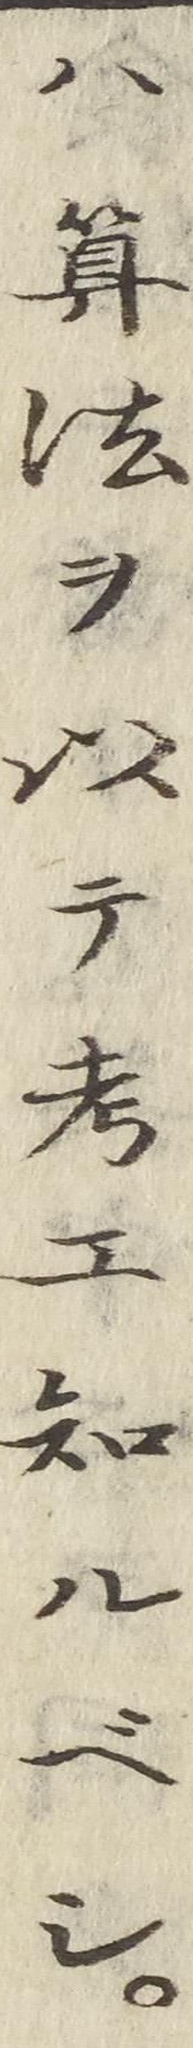ハ算法ヲ以テ考エ知ルベシ。
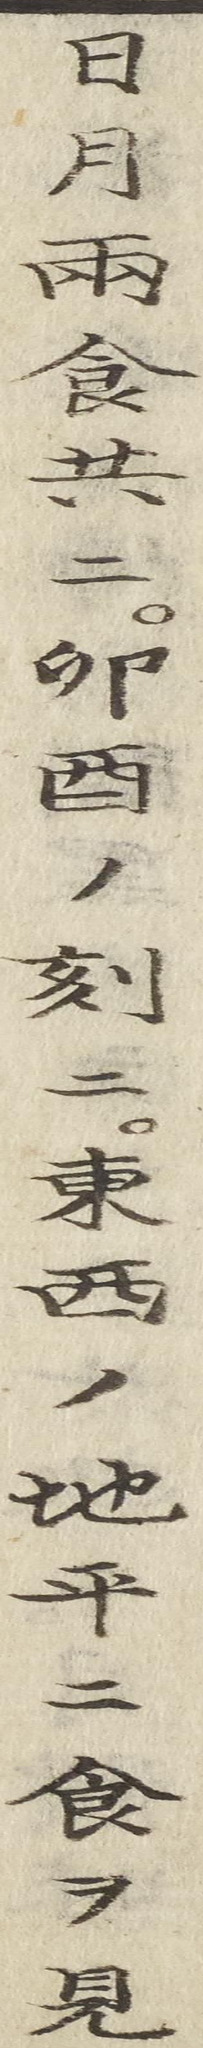日月両食共ニ。卯酉ノ刻ニ。東西ノ地平ニ食ヲ見
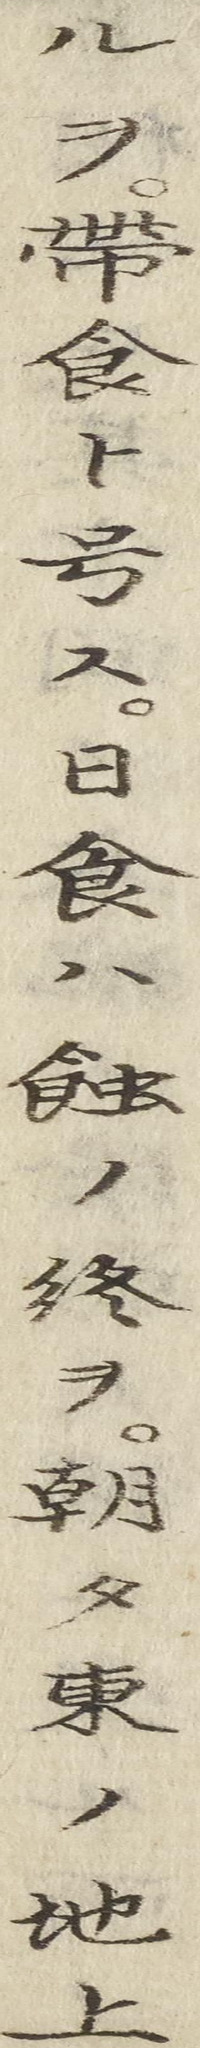ルヲ。帯食ト号ス。日食ハ蝕ノ終ヲ。朝夕東ノ地上
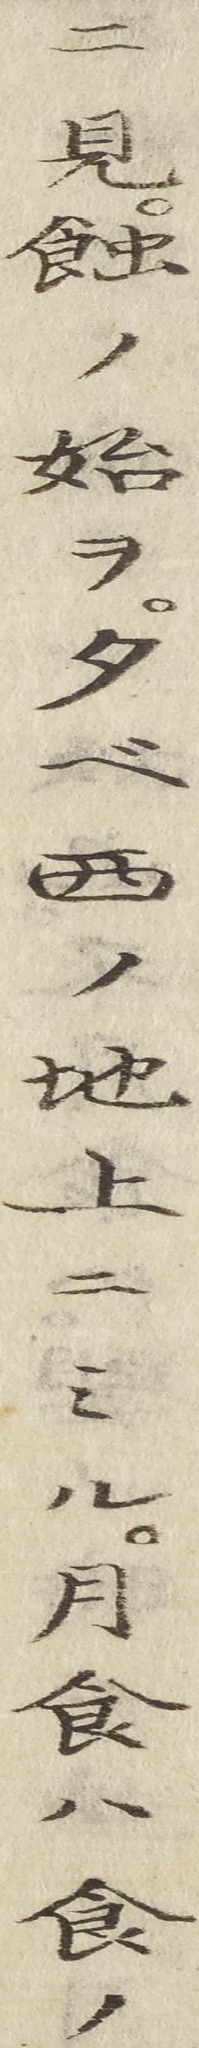ニ見。蝕ノ始ヲ。夕ベ西ノ地上ニミル。月食ハ食ノ
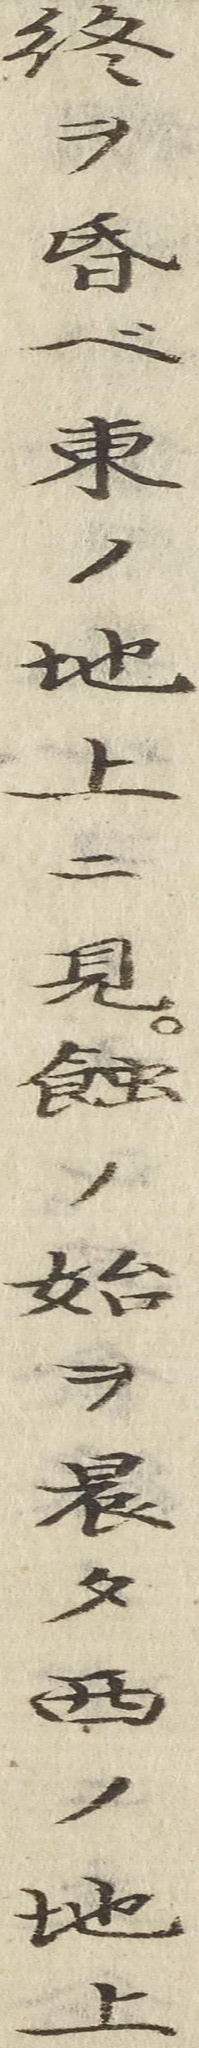終ヲ昏ベ東ノ地上ニ見。蝕ノ始ヲ晨タ西ノ地上
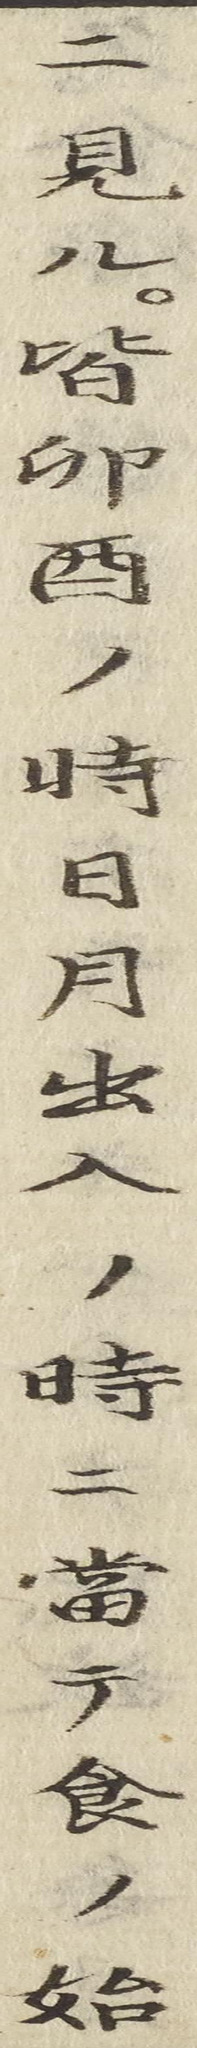ニ見ル。皆卯酉ノ時日月出入ノ時ニ当テ食ノ始
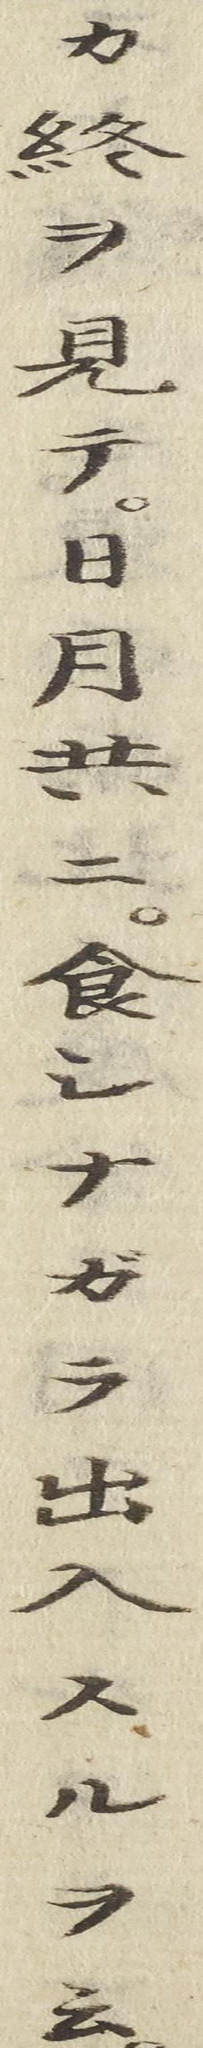カ終ヲ見テ。日月共ニ。食シナガラ出入スルヲ云。
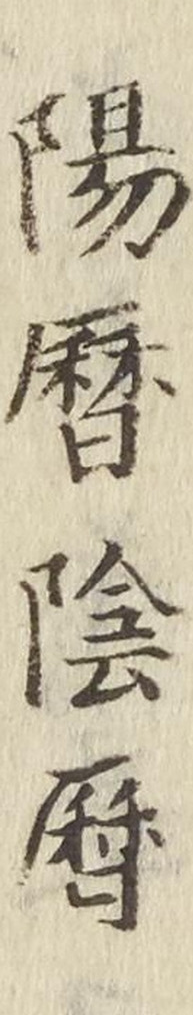陽暦陰暦
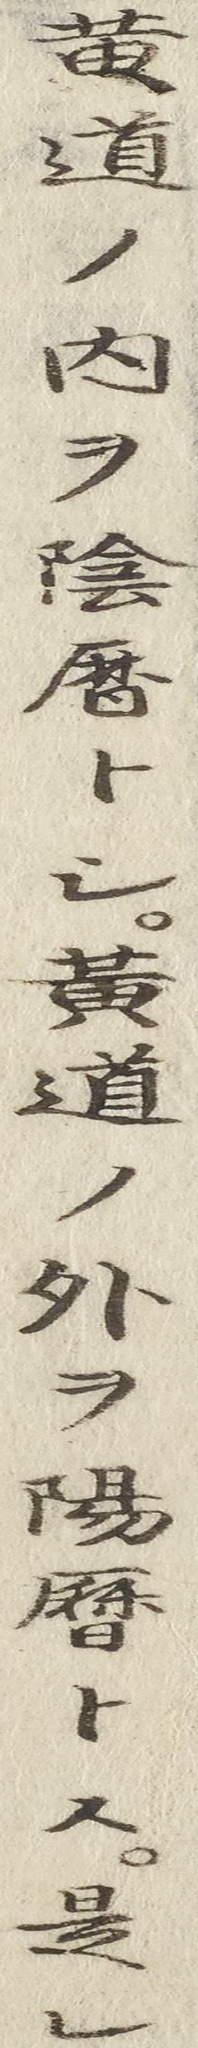黄道ノ内ヲ陰暦トシ。黄道ノ外ヲ陽暦トス。是レ
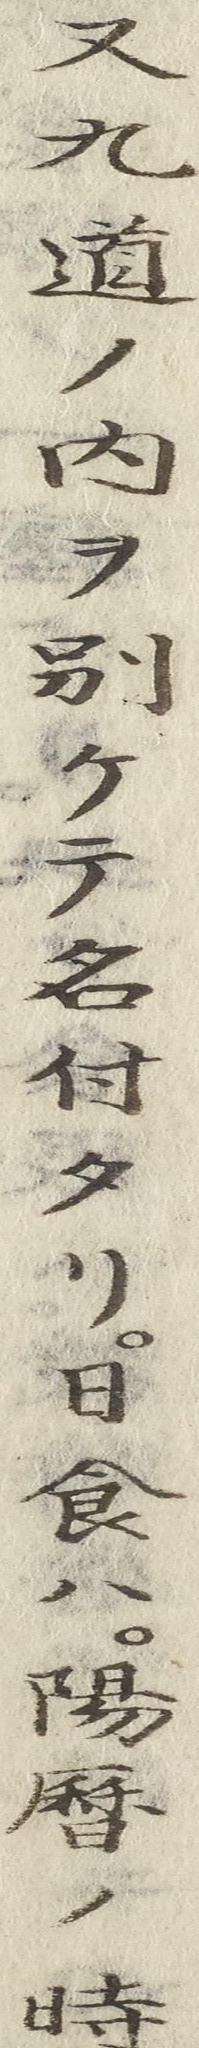又九道ノ内ヲ別ケテ名付タリ。日食ハ。陽暦ノ時
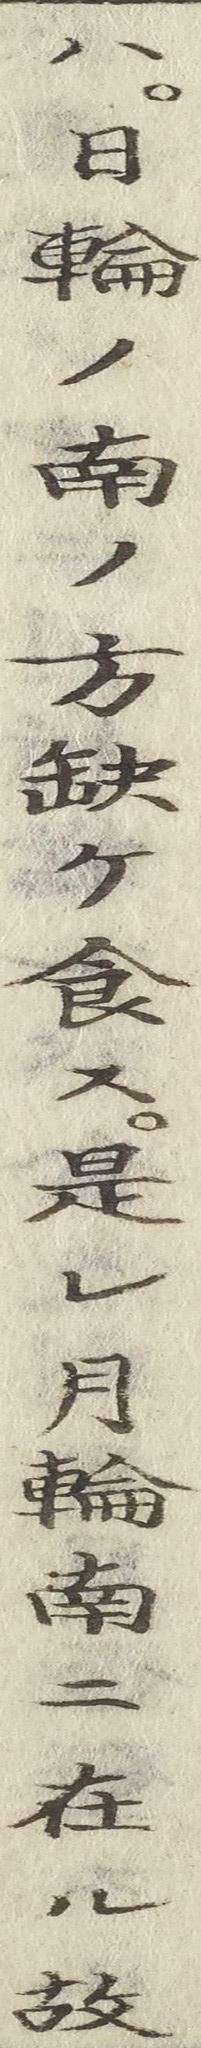ハ。日輪ノ南ノ方缺ケ食ス。是レ月輪南ニ在ル故
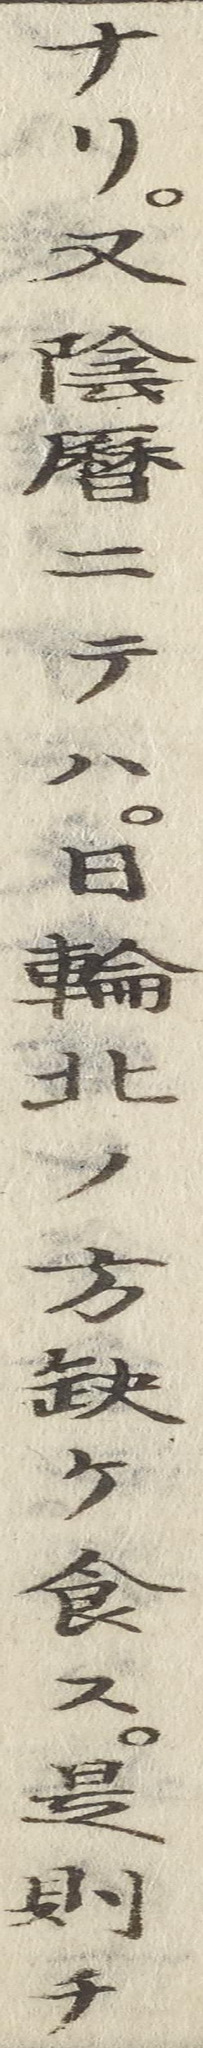ナリ。又陰暦ニテハ。日輪北ノ方缺ケ食ス。是即チ
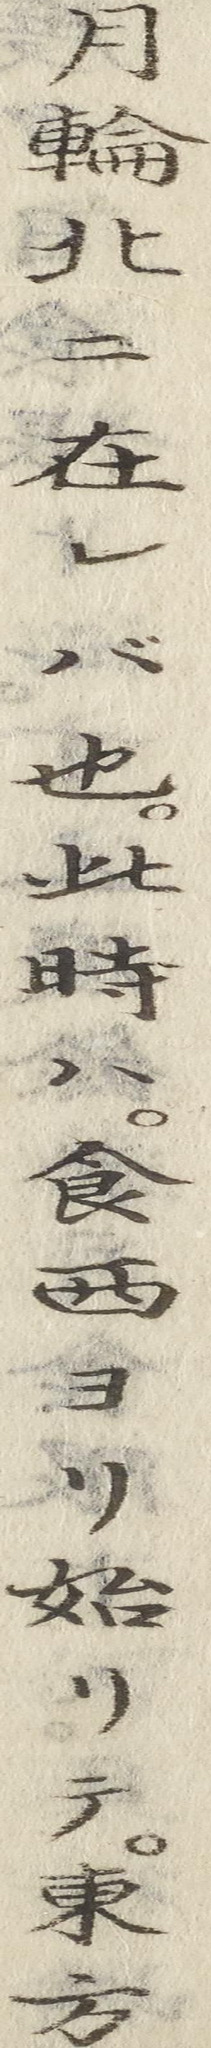月輪北ニ在レバ也。此時ハ。食西ヨリ始リテ。東方
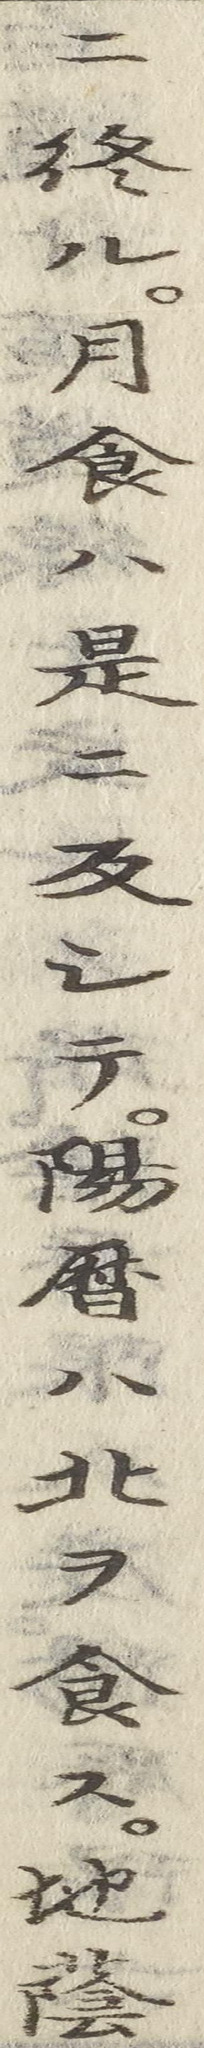ニ終ル。月食ハ是ニ反シテ。陽暦ハ北ヲ食ス。地蔭
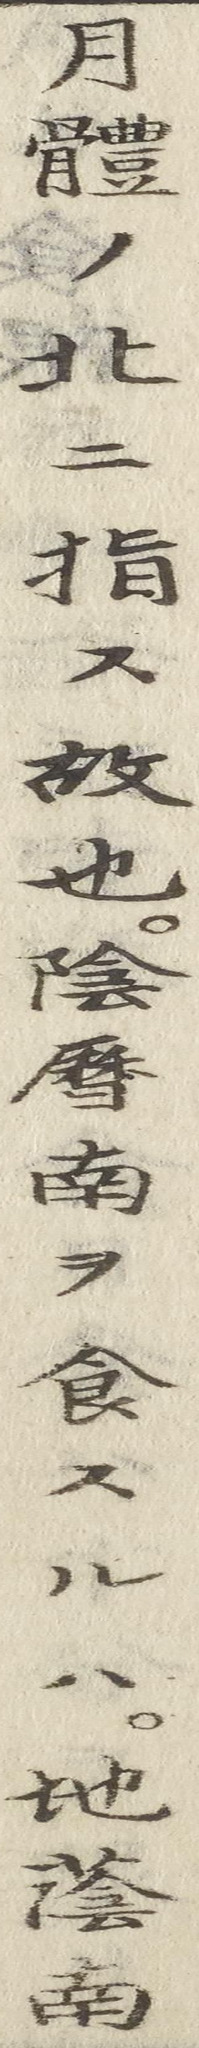月体ノ北ニ指ス故也。陰暦南ヲ食スルハ。地蔭南
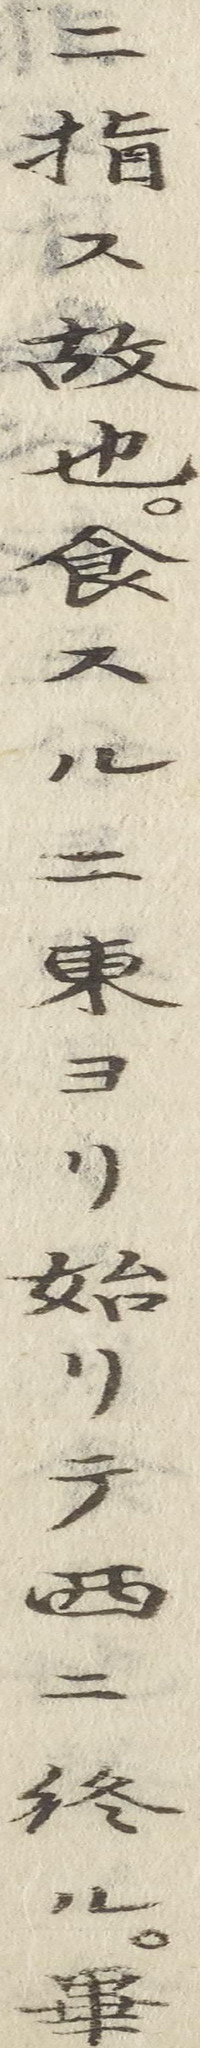ニ指ス故也。食スルニ東ヨリ始リテ西ニ終ル。畢
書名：大略天学名目鈔　天經或問附録
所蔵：東京大学地震研究所図書室 Earthquake Research Institute Library, The University of Tokyo, JAPAN
